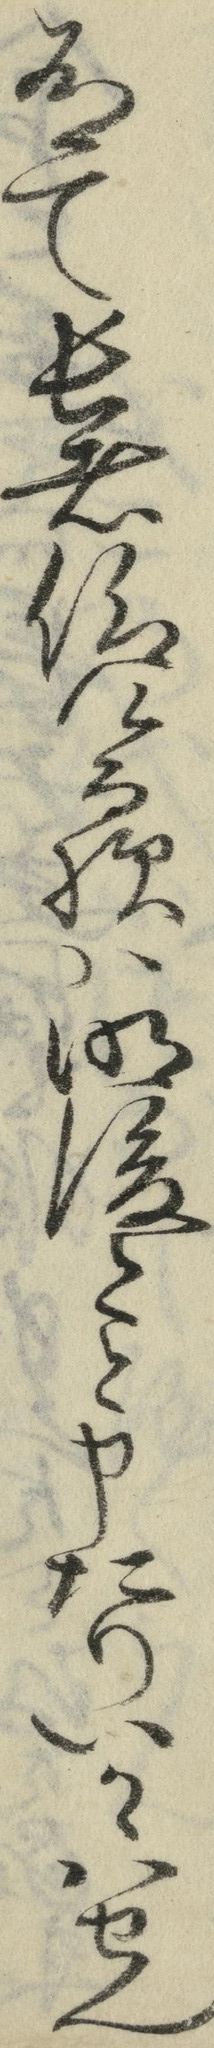有て長者仰ける様は明後こと申たりいかゝはせん
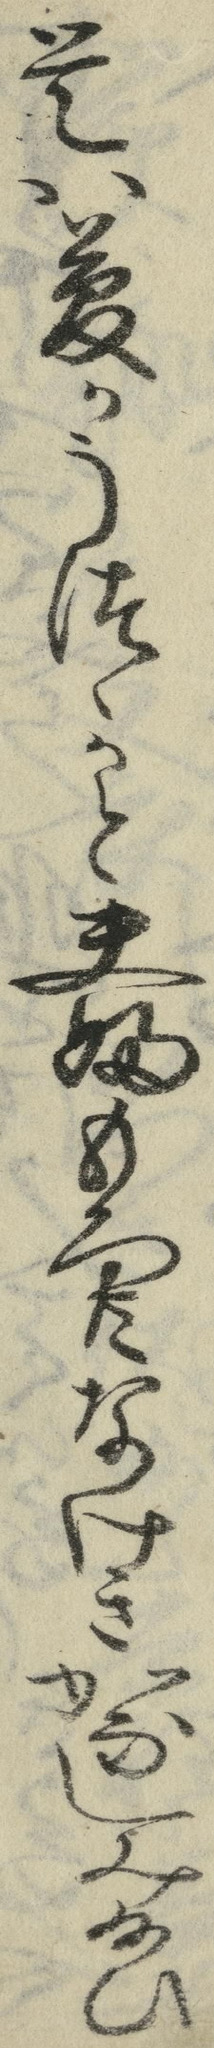是は夢かうつゝかと夫婦もろ共なけきかなしみ給ひ

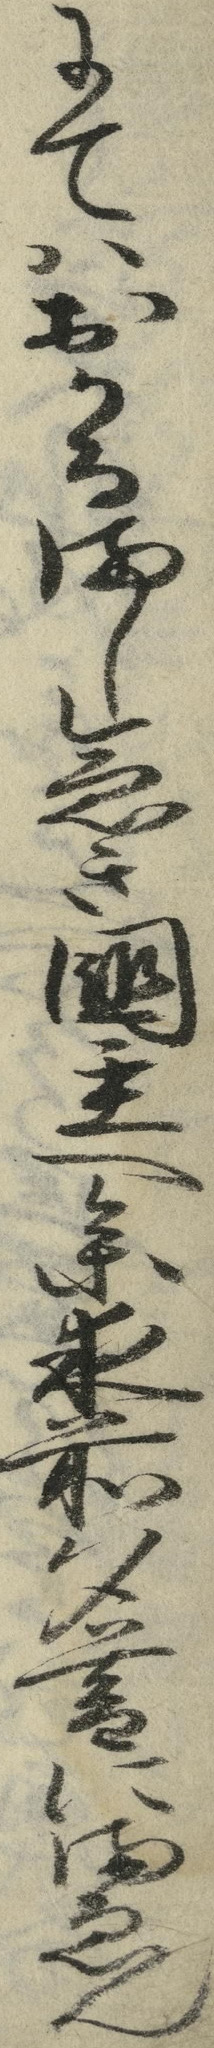にてはおかるまし急き国主へ参夜前夕暮にまゑん
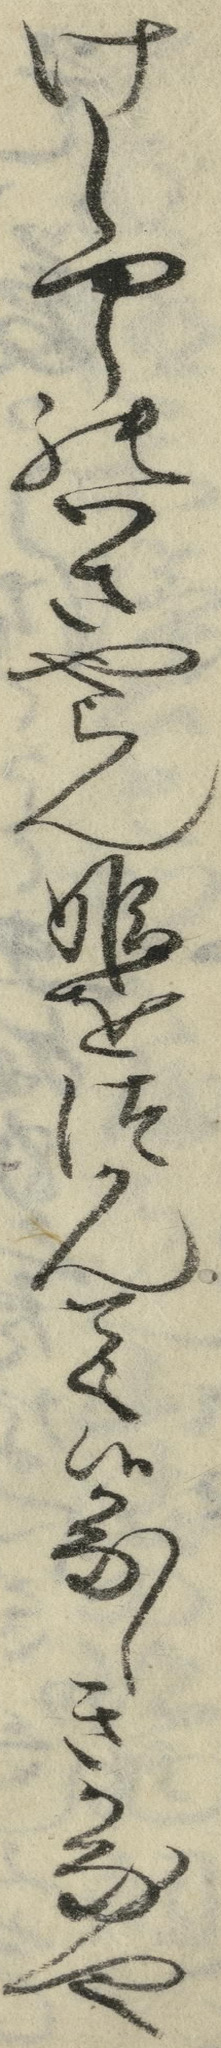けしやうのわさやらん姫をつかんても候かなしきかなや
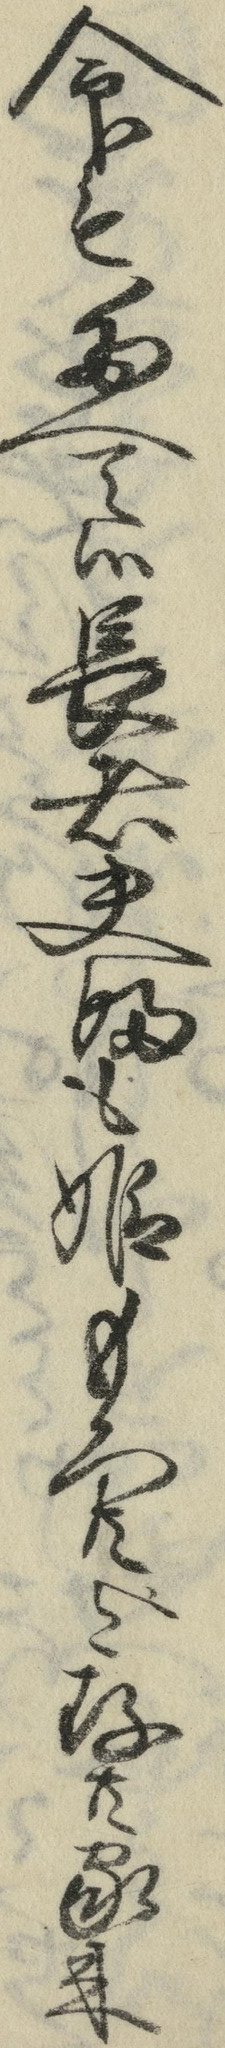命もたへて候長者夫婦も姫もろ共存共家来
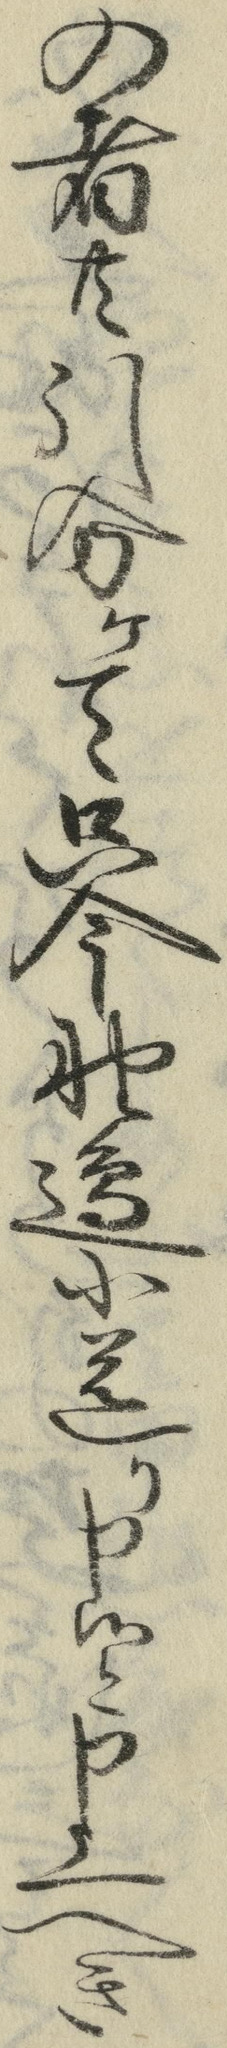の者共引分只今野辺に送り申候と申上へき
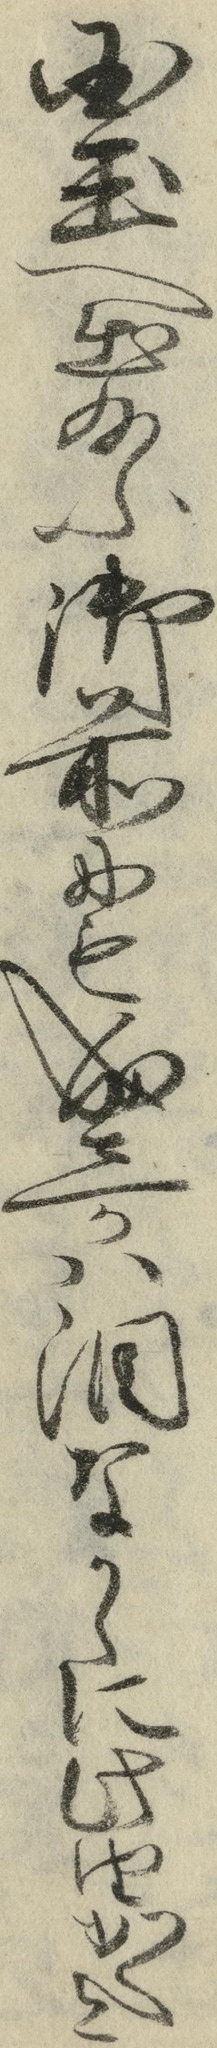国玉へ出給ふ御前にも成しかは涙なからに此由かくと
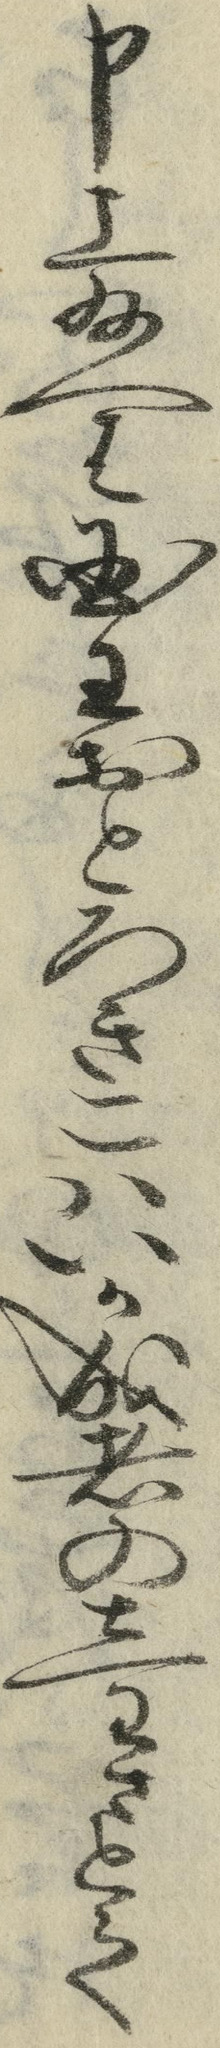申上給へは国主おとろきこはいか成者のしわさとて
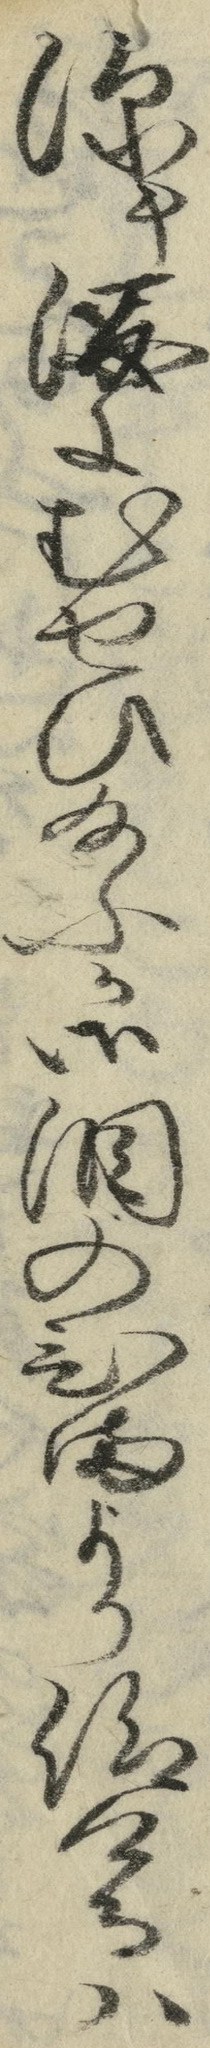深涙にむせひ給ふか御涙のひまより仰けるは
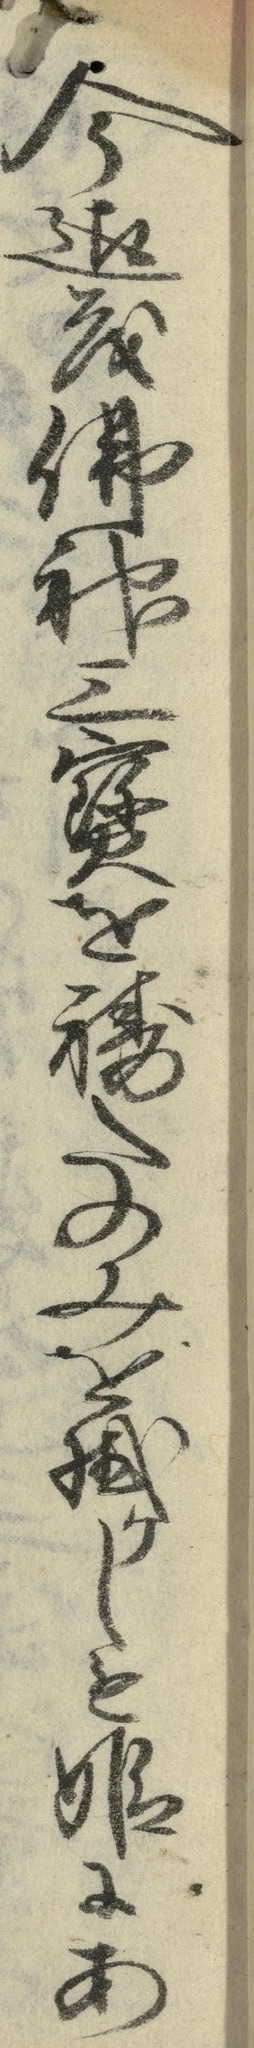今迄も仏神三宝を祈るたのみを掛姫にあ
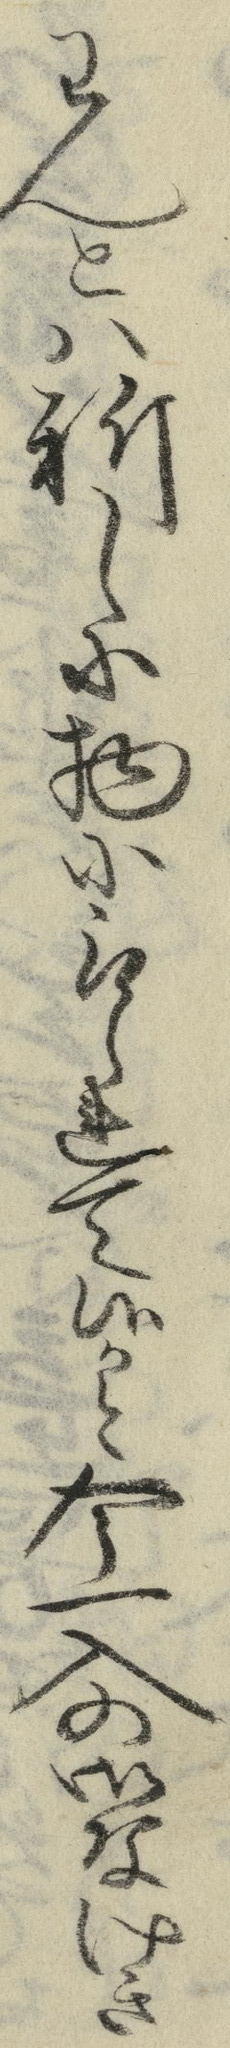わんとは祈しに物に取られて候かと今一入の御なけき
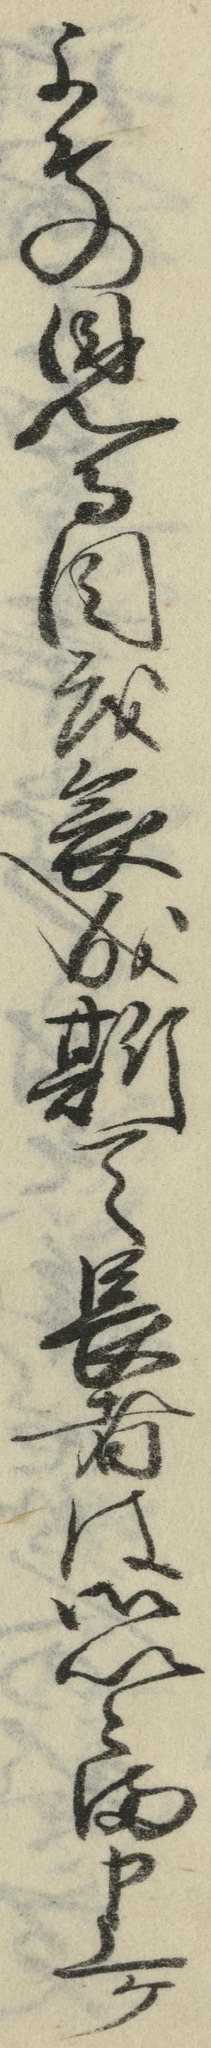よその見る目も哀成斯て長者は御いとま申上
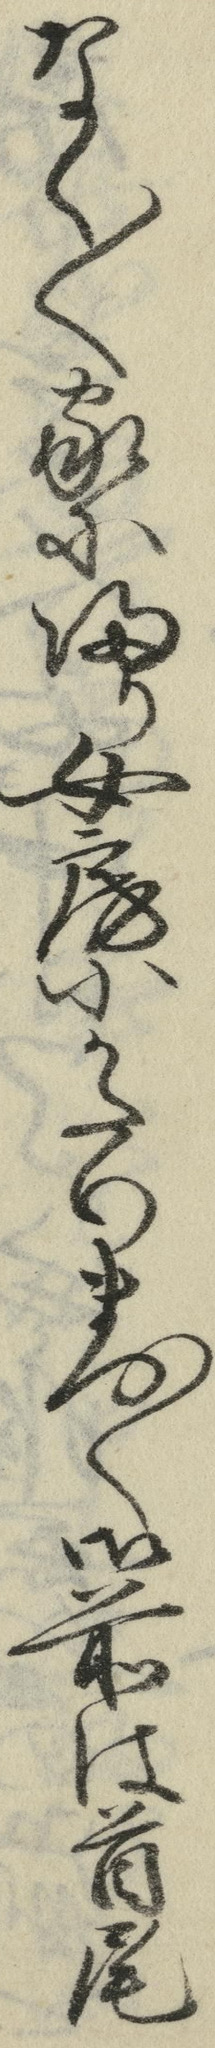なく〳〵家に帰り女房にかたりまつ〳〵御前は首尾
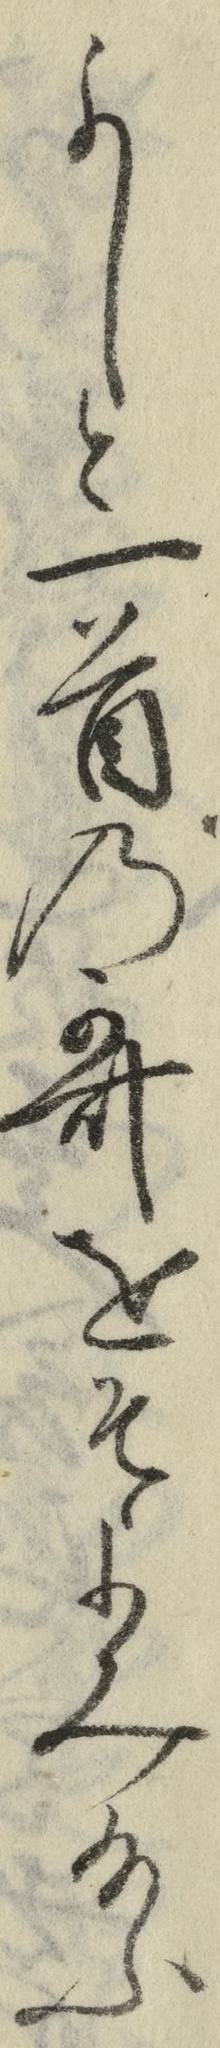よしと一首の歌をそよみ給ふ
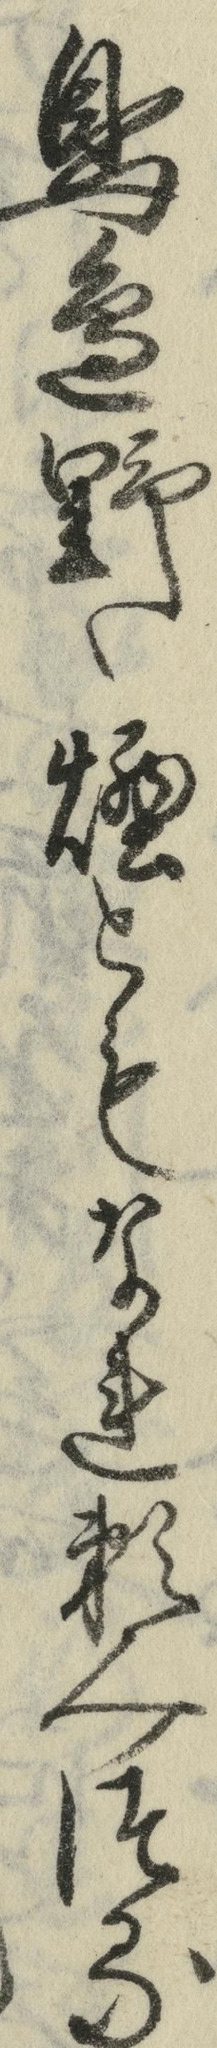鳥辺野ゝ煙ともなれ頼みつる
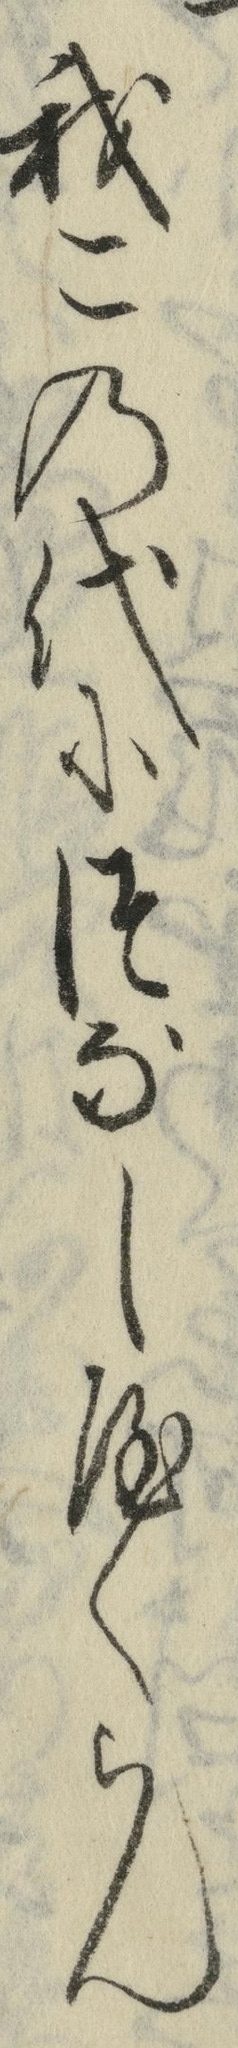我この代につなしやくらん
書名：浅間記
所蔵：東京大学地震研究所図書室 Earthquake Research Institute Library, The University of Tokyo, JAPAN
